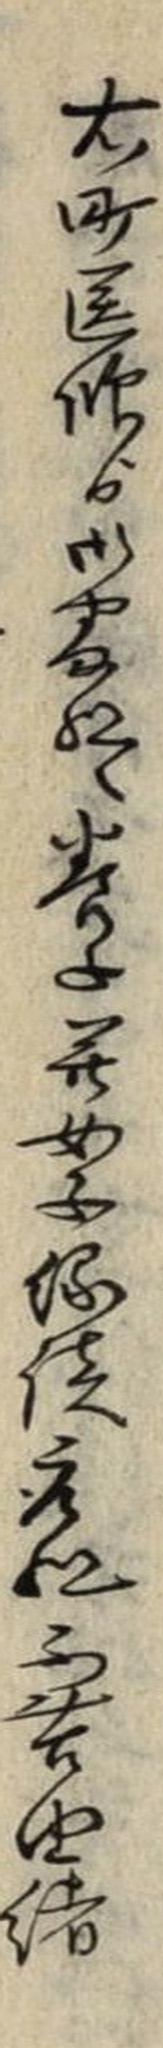右町医師ゟ御番組ヘ養子并女子縁談取組不苦由緒
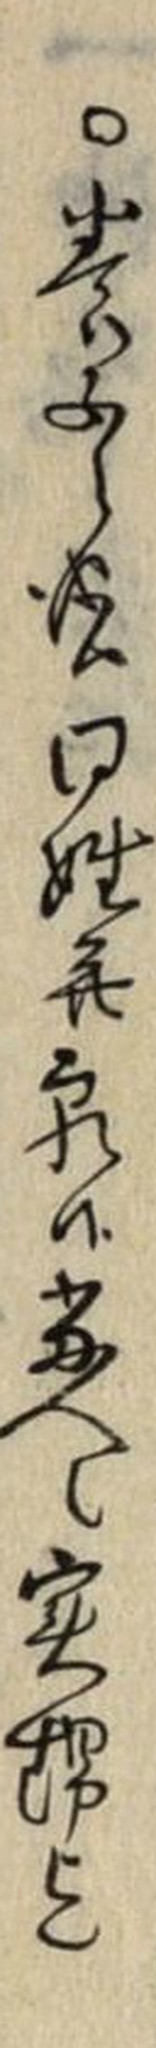○養子之儀ハ同姓并願候当人之実甥迄
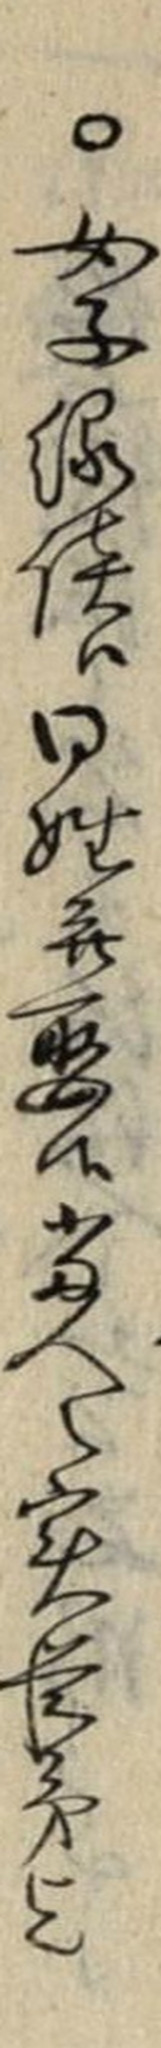○女子縁談ハ同姓并娶候当人之実従弟迄
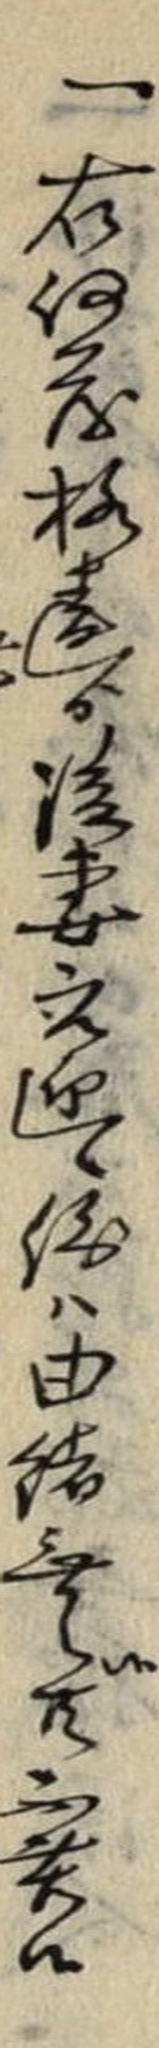一右何茂格違ゟノ後妻取迎候儀ハ由緒無之候共不苦候
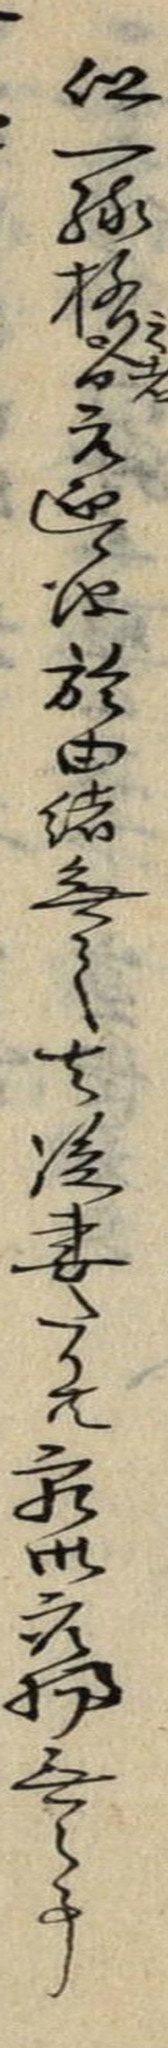但一統格之者ゟ取迎候儀於由緒無之者後妻たり共願御取揚無之事
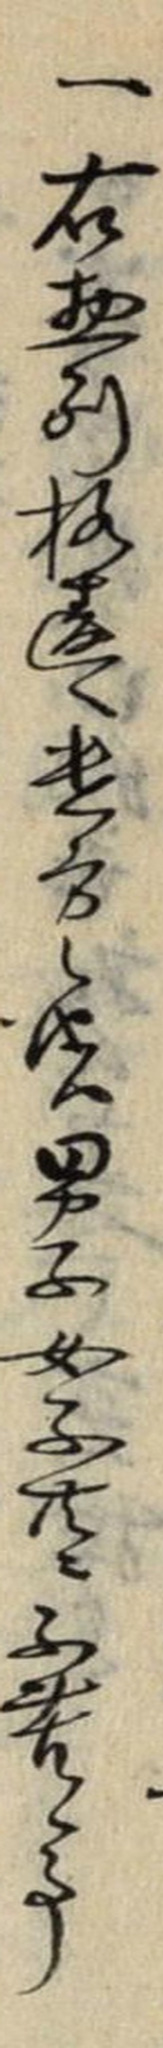一右惣別格違へ遣方之儀ハ男子女子共ニ不苦候事
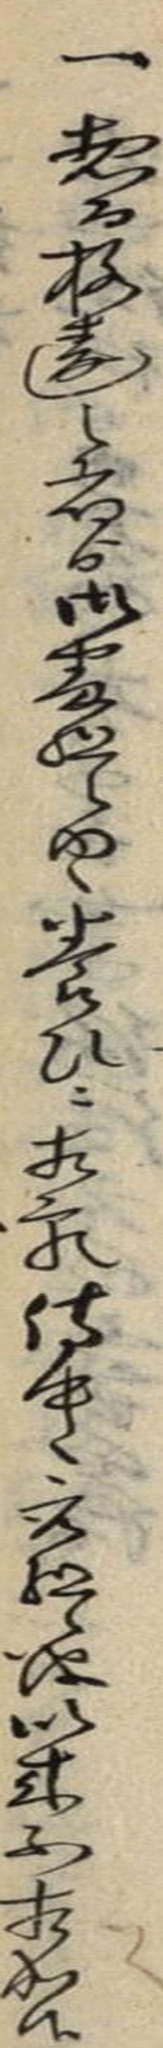一惣而格違之者ゟ御番組之内ヘ養ひニ相願侍中ヘ取組候儀以来不相成候
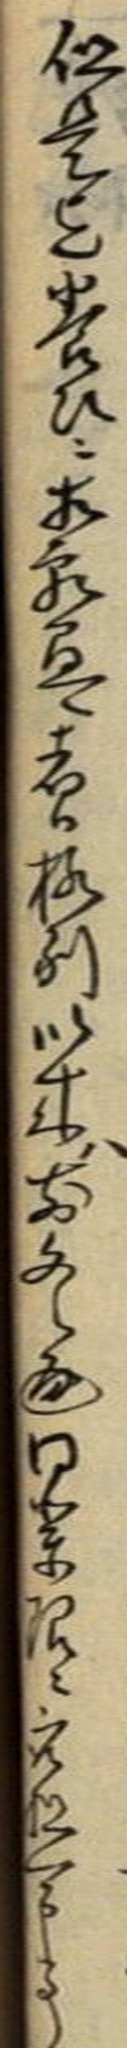但是迄養ひニ相願置候者ハ格別以来ハ前文之通同輩限ニ取組可申事
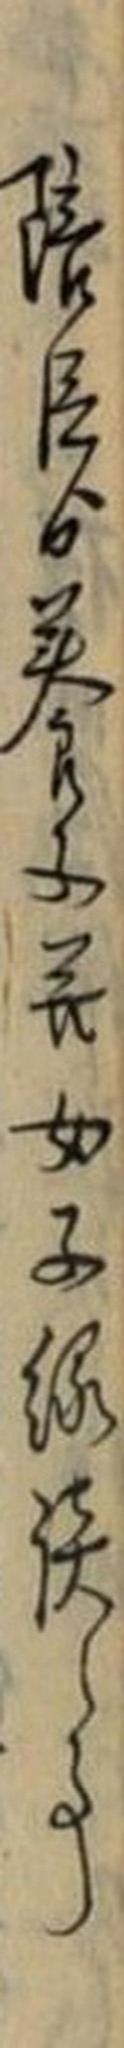陪臣ゟ養子并女子縁談之事
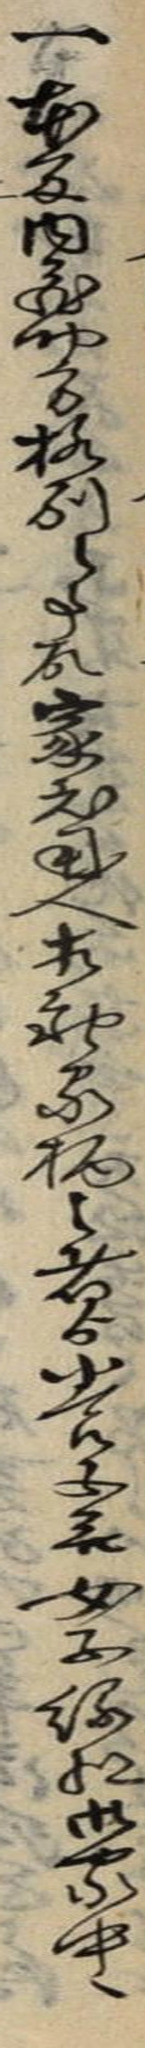一本多内蔵助方格別之事故家老用人相勤候家柄之者ゟ養子并女子縁組御家中ヘ
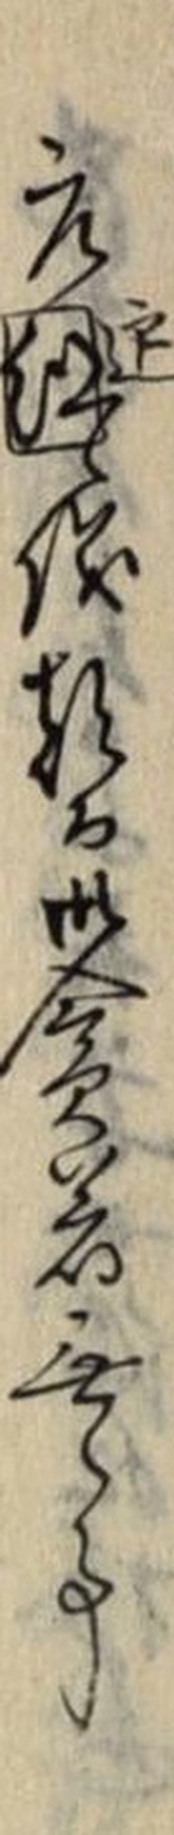取組候儀都而御貧着無之事
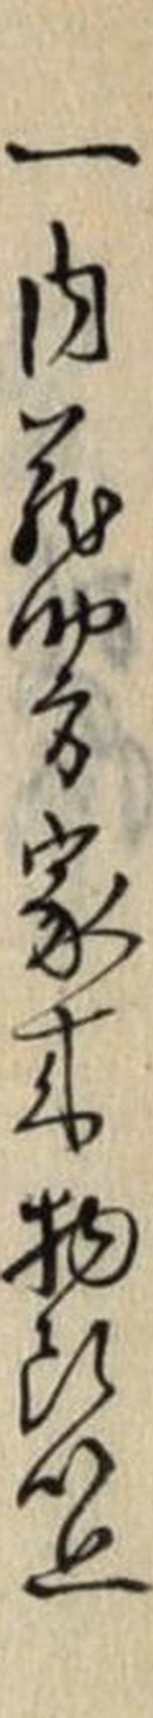一内蔵助方家来物頭以上
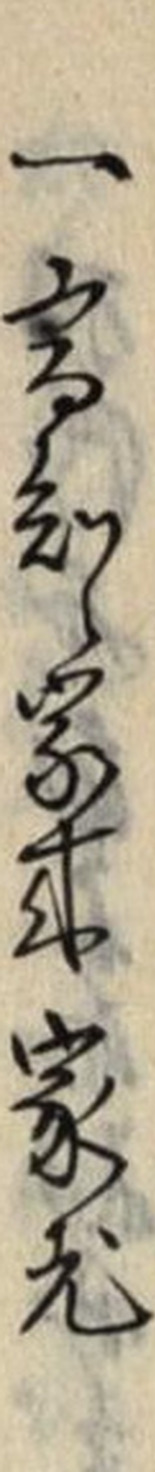一高知之家来家老
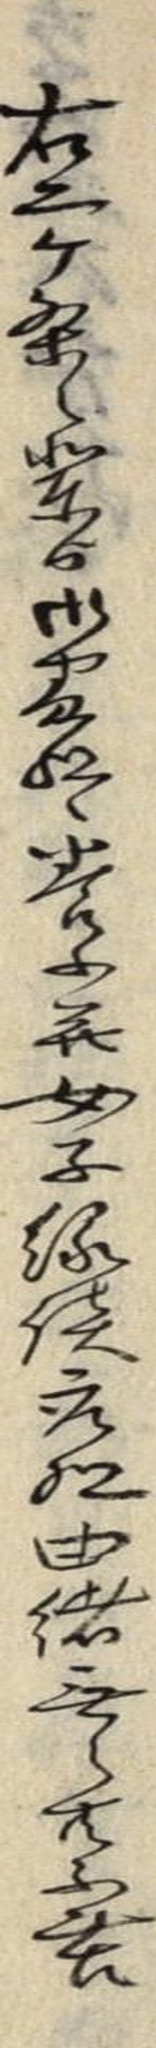右二ヶ条之輩ゟ御番組ヘ養子并女子縁談取組由緒無之共不苦
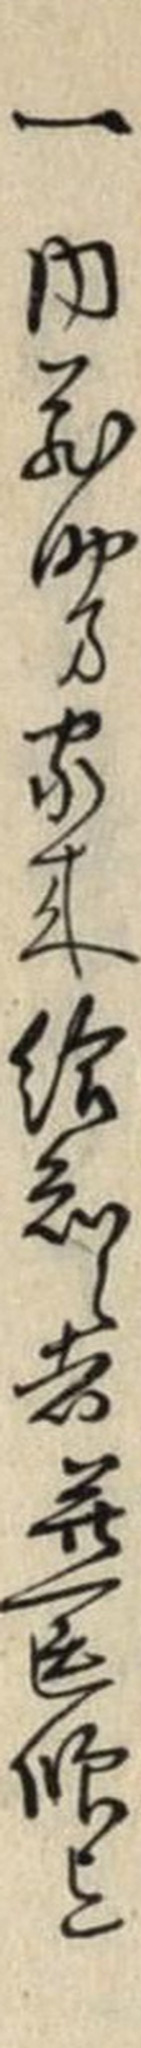一内蔵助方家来給知之者并医師迄
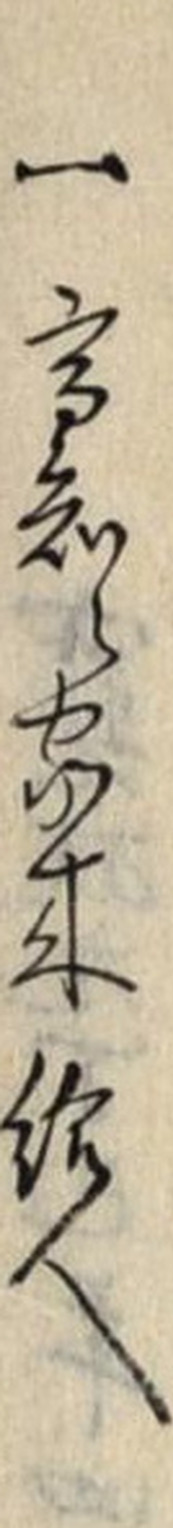一高知之家来給人
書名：養子縁組之部
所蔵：福井県文書館 Fukui Prefectural Archives
